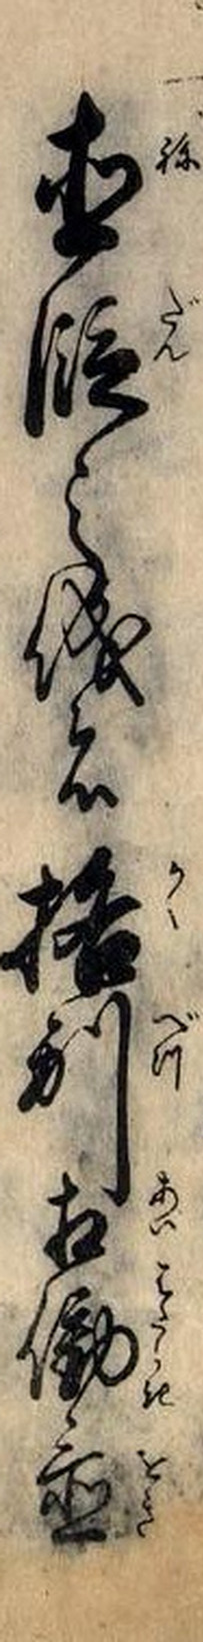直段之儀者格別相働置
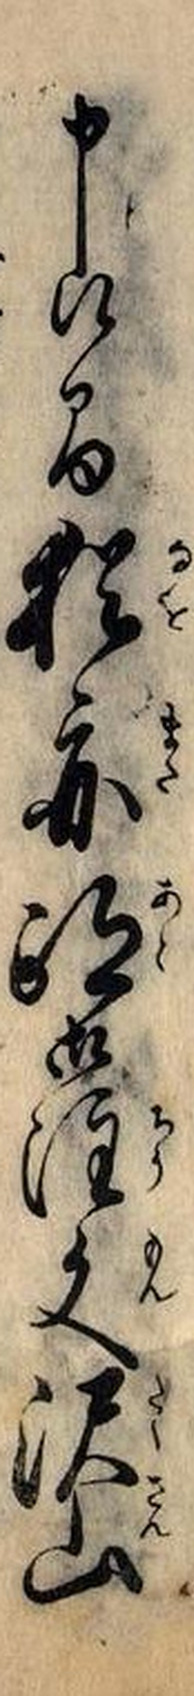申候間猶亦跡御注文沢山
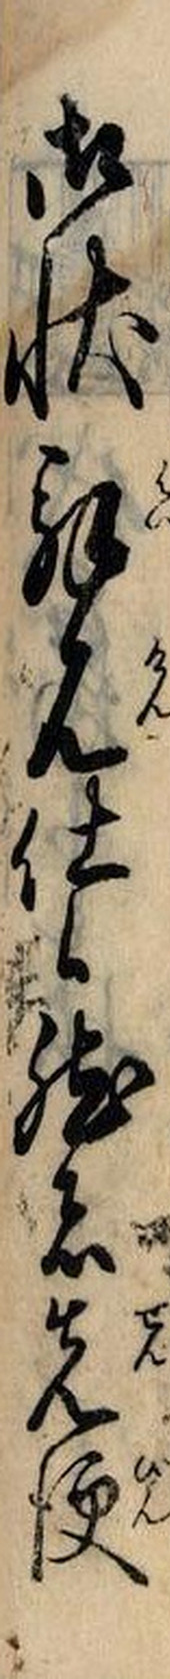御状拝見仕候然者先便
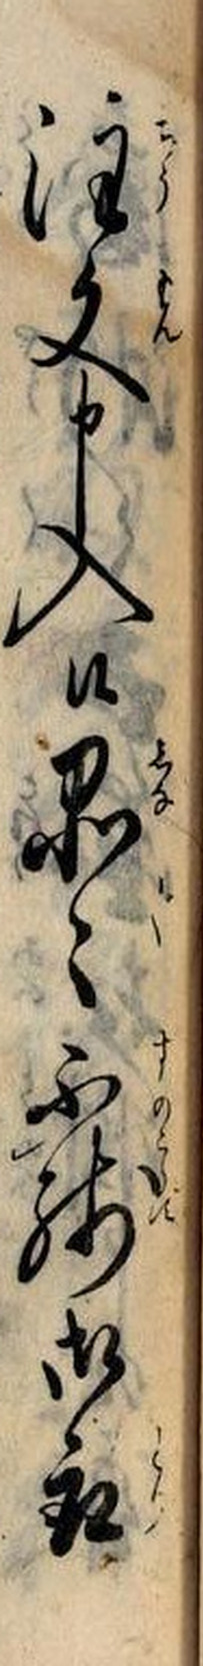注文申入候品々不残御取
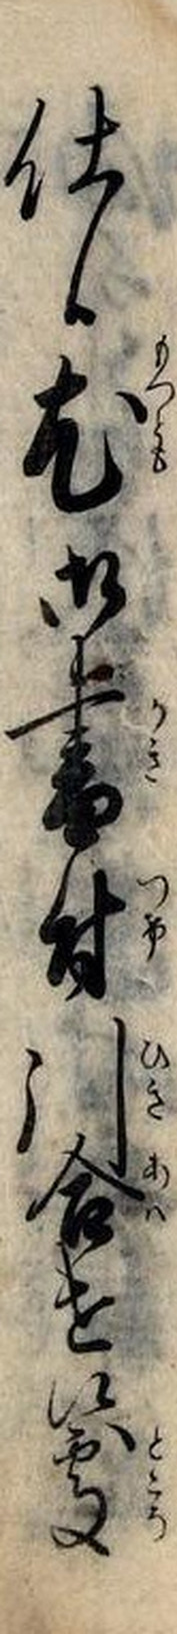仕候尤御書付引合せ候處
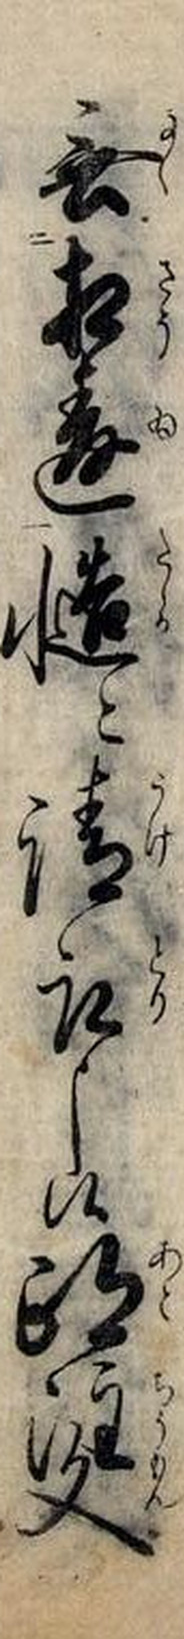無相違慥に請取申候跡注文

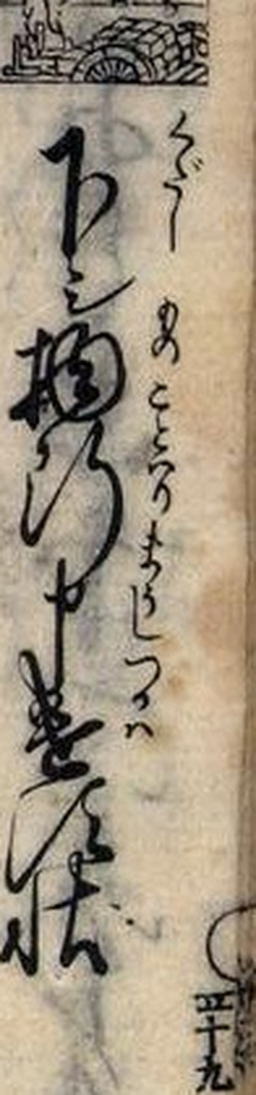下シ物断申遣す状
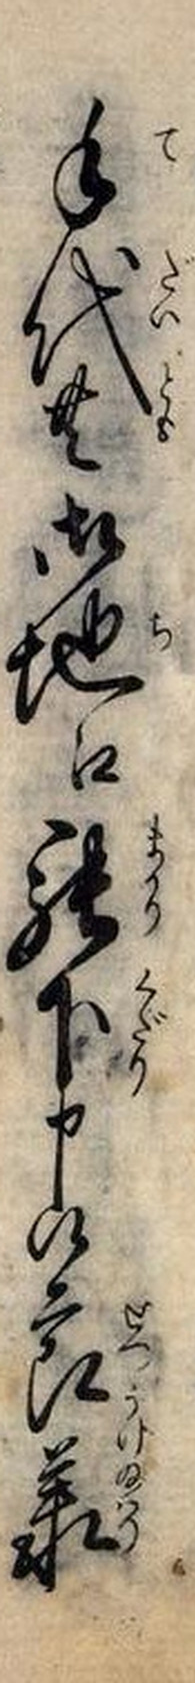手代共御地江罷下申候節承
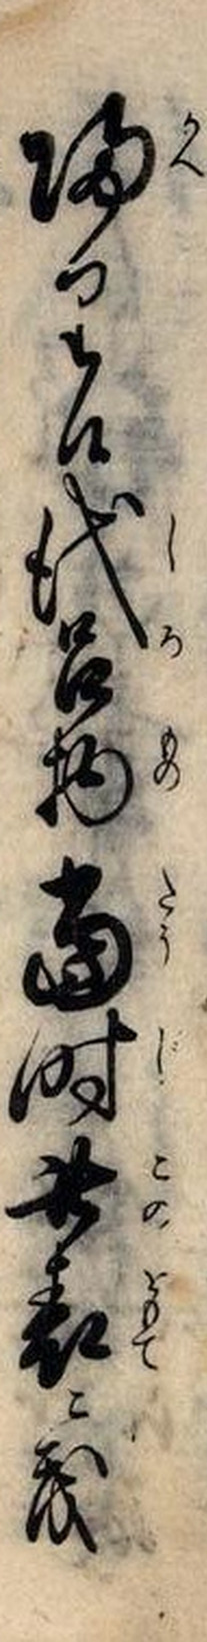帰り候代呂物當時此表にも
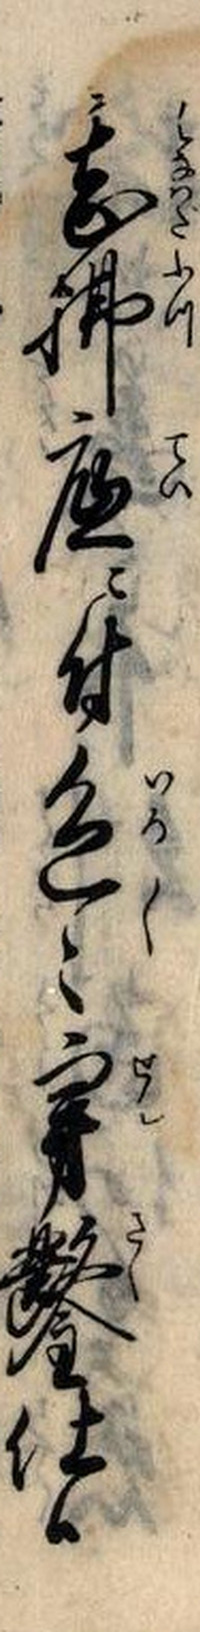甚拂底に付色々穿鑿仕候
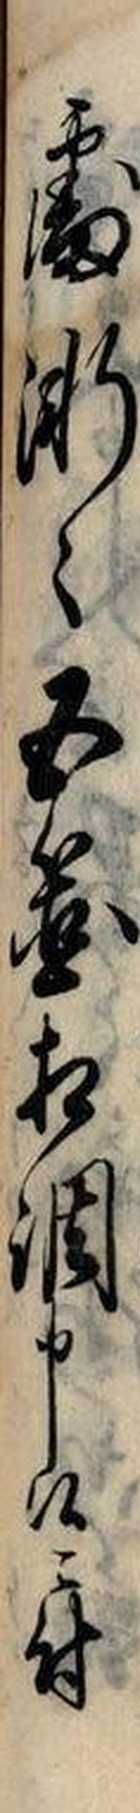處漸々五箇相調申候に付
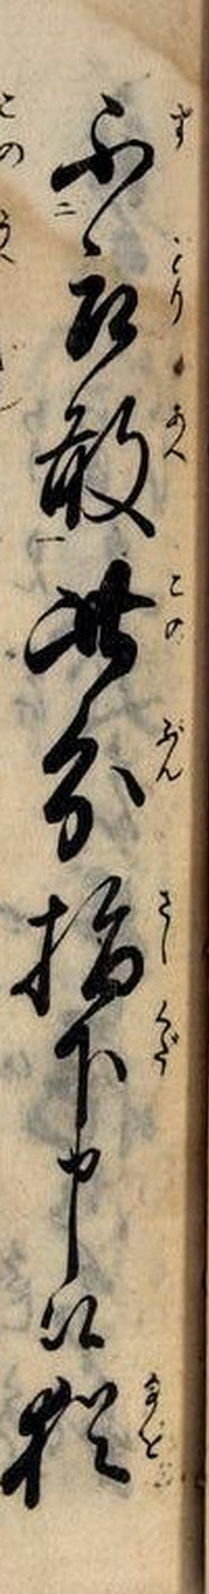不取敢此分指下申候猶
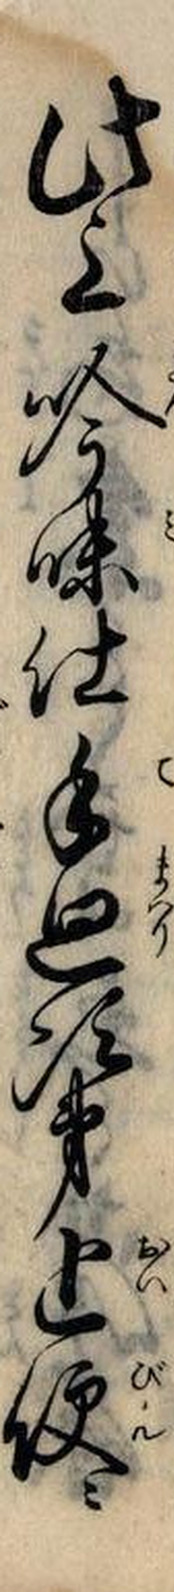此上吟味仕手廻次第追便に
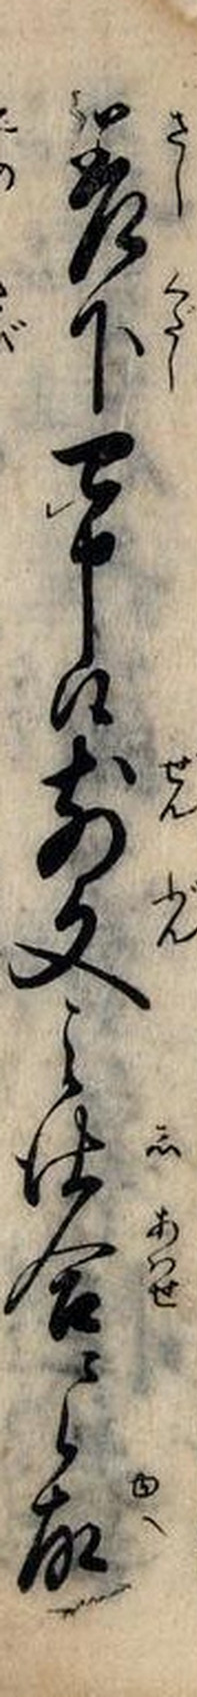差下可申候前文之仕合に候故
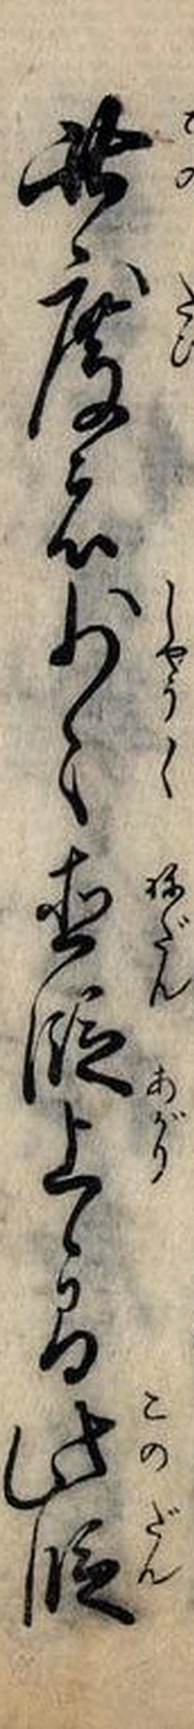此度者少々直段上候間此段

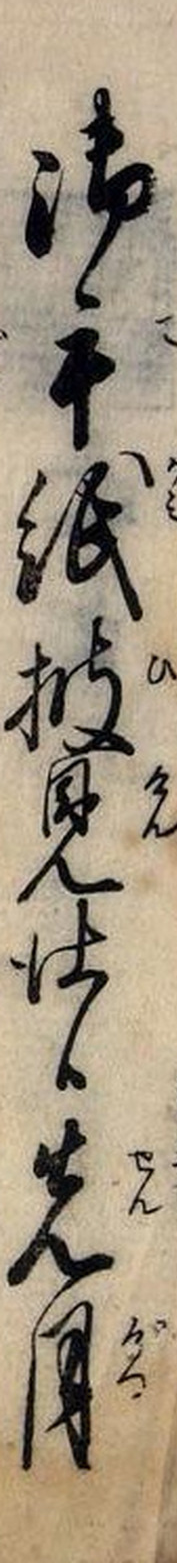御手紙被見仕候先月
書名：大成用文章（往来物）
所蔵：福井県文書館 Fukui Prefectural Archives
